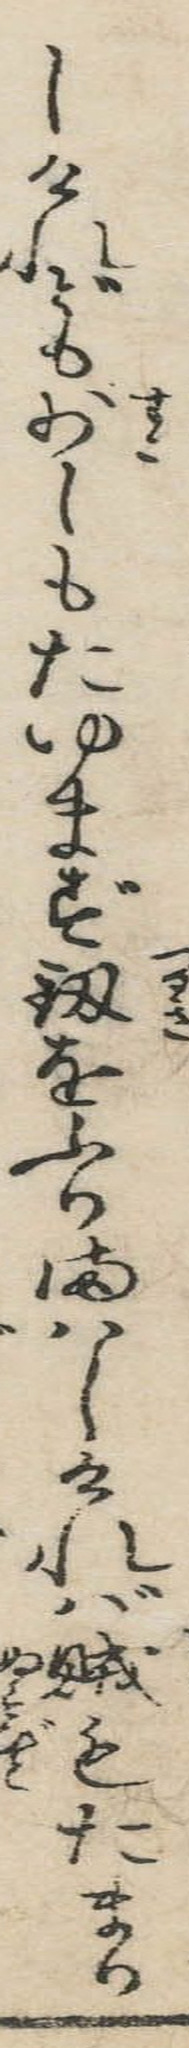しけれども少しもたゆまず釼をふりまはしければ賊もたまり
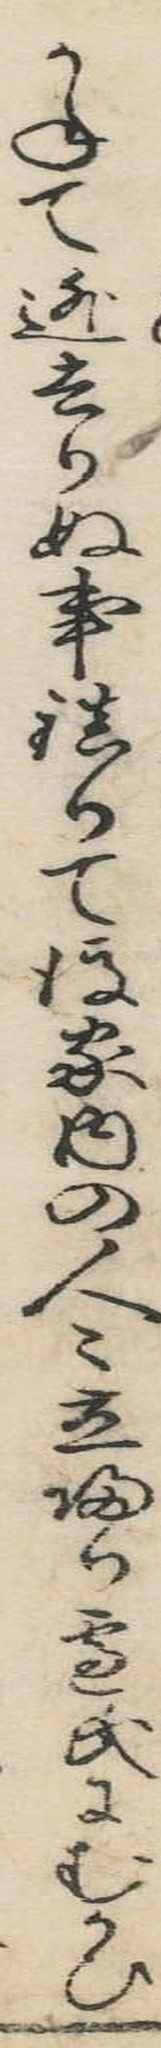かねて逃去りぬ事鎮りて後家内の人々立帰り盧氏にむかひ
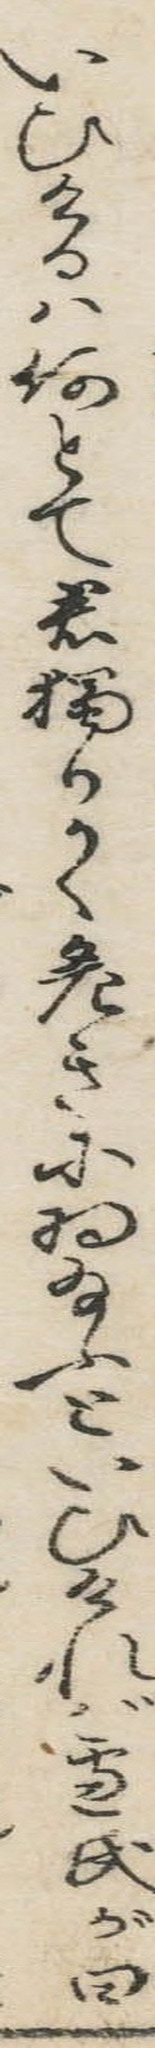いひけるは何とて君独りかく危きにゐ給ふといひければ盧氏が曰
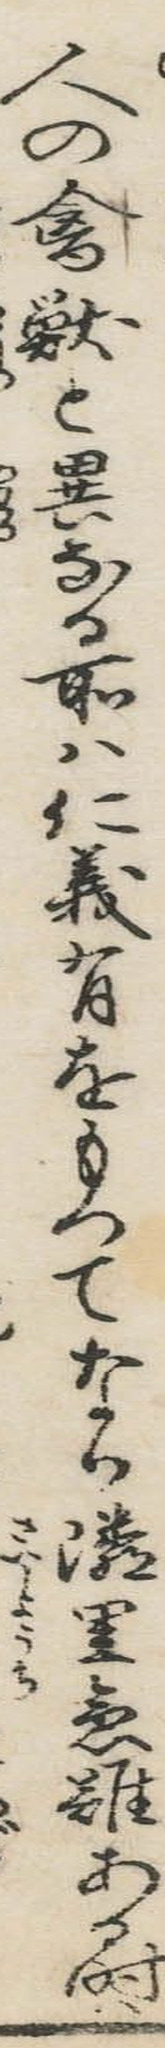人の禽獣と異なる所は仁義有をもつてなり隣里急難ある時は
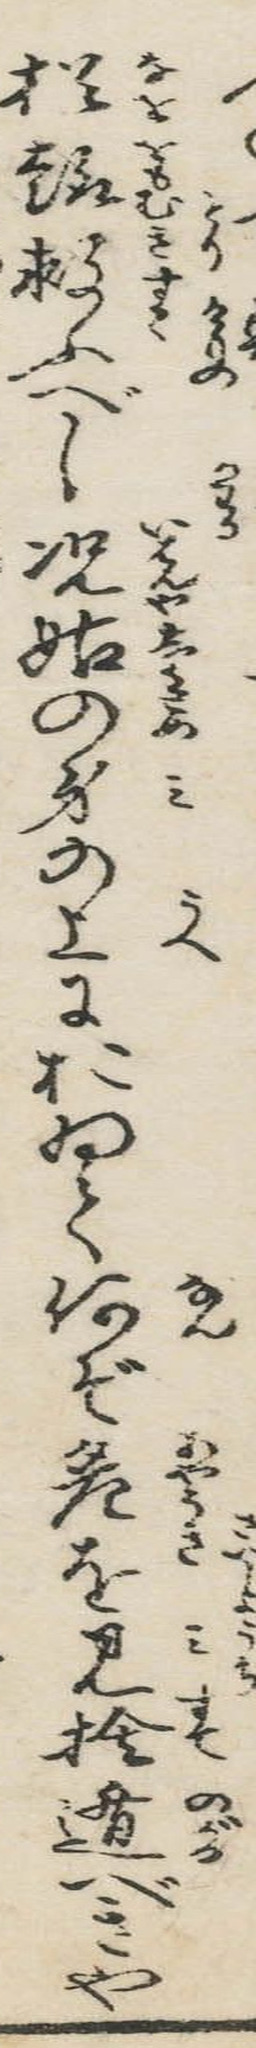猶趣救ふべし況姑の身の上におゐて何ぞ危を見捨遁べきや
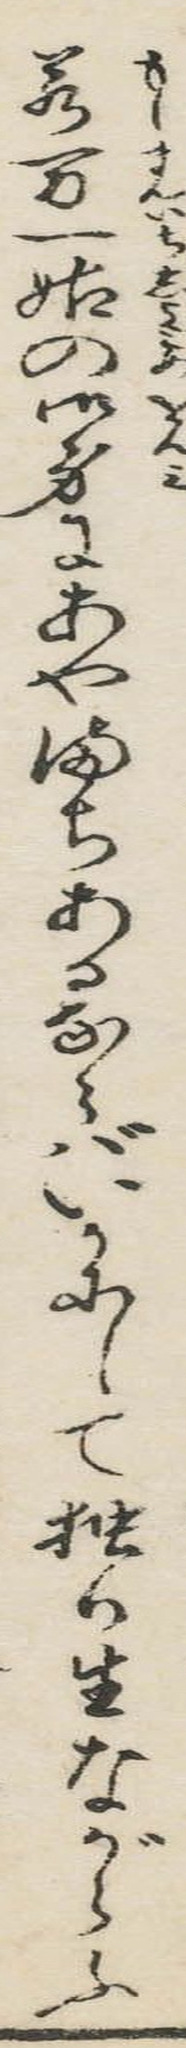若万一姑の御身にあやまちあるならばいかにして独り生ながらふ
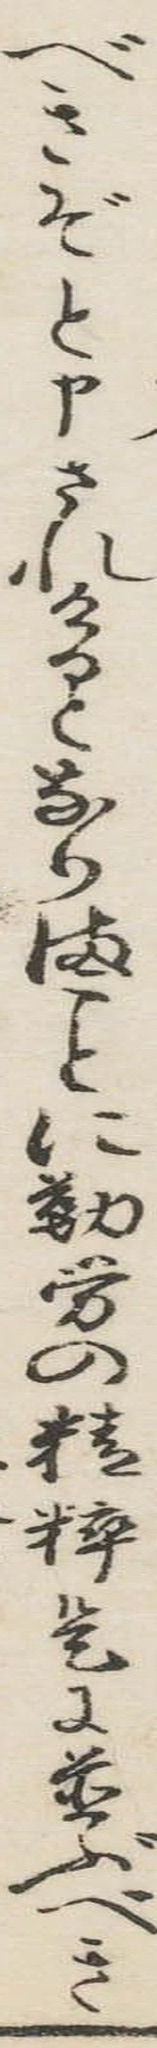べきぞと申されけるとなりまことに勤労の精粋是に並ぶべき
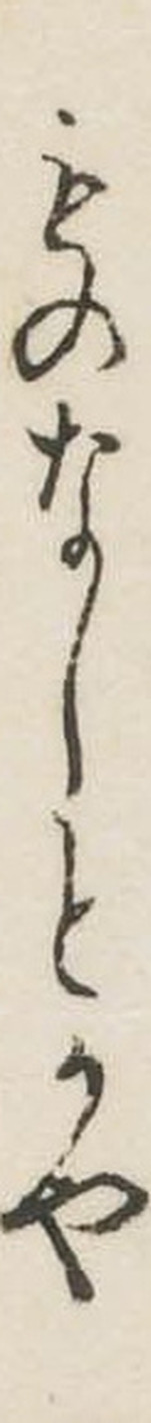ものなしとかや
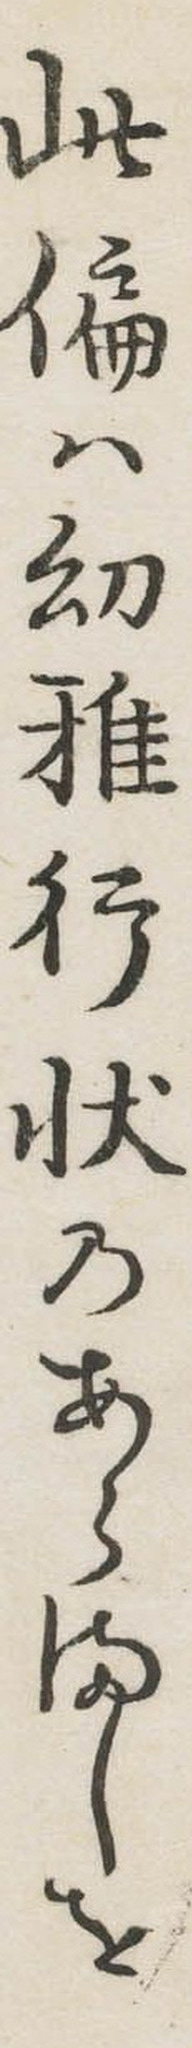此偏は幼稚行状のあらましを
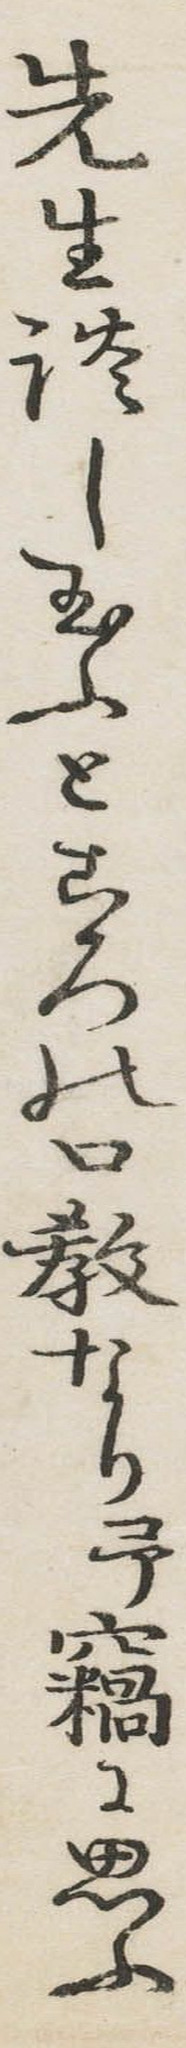先生談し玉ふところの口教なり予竊に思ふ
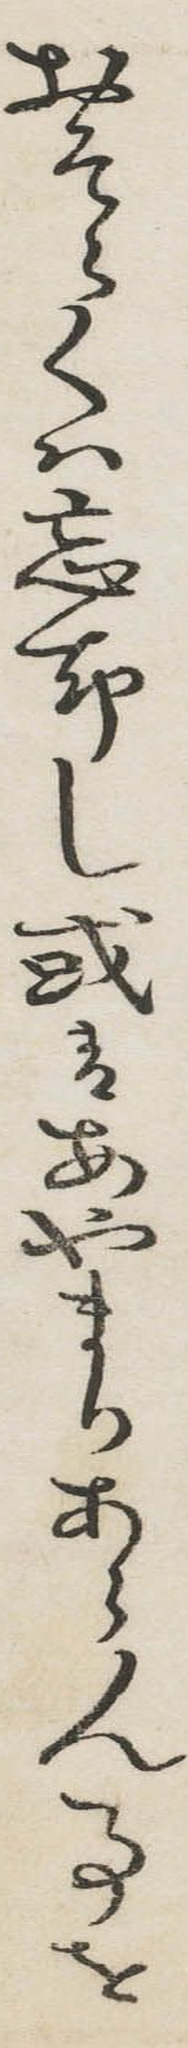おそらくは忘却し或はやまりあらん事を
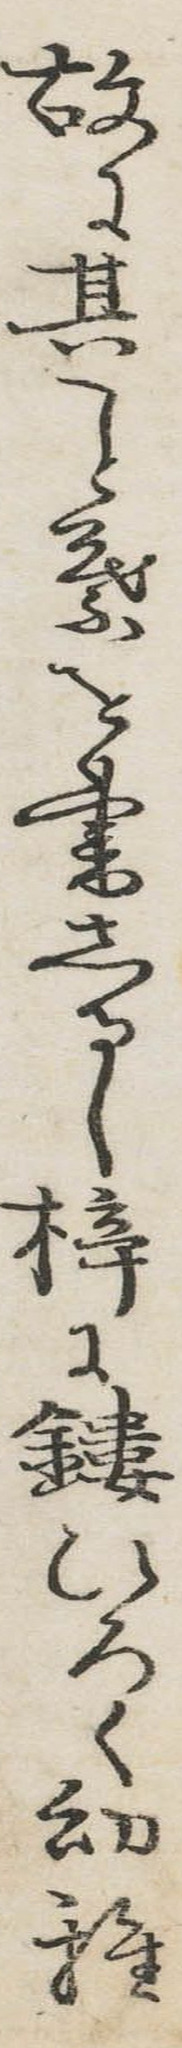故に其ことはを書しるし梓に鏤ひろく幼稚
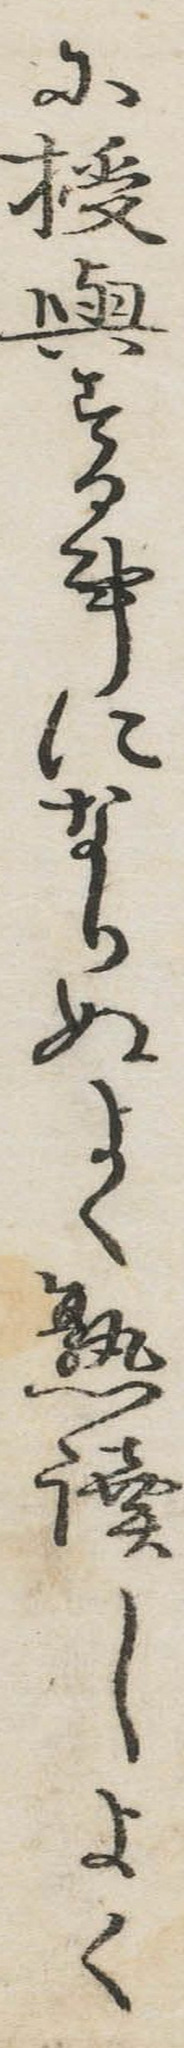に授与する事になりぬよく熟読しよく
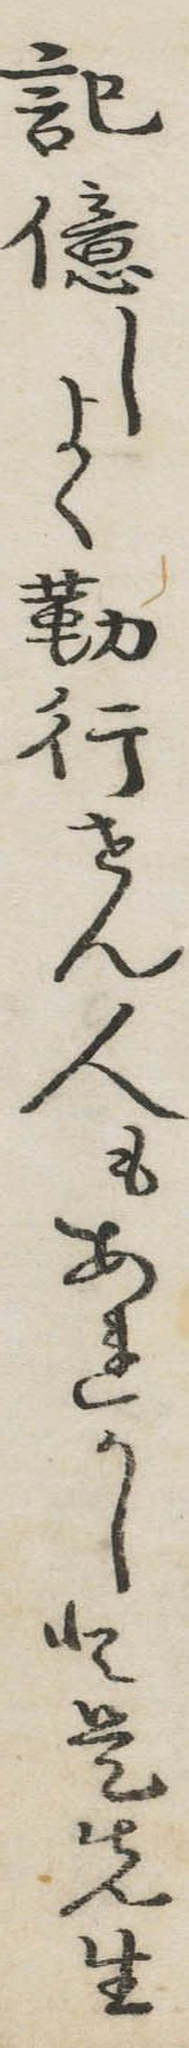記憶しよく勤行せん人もあれかしと是先生
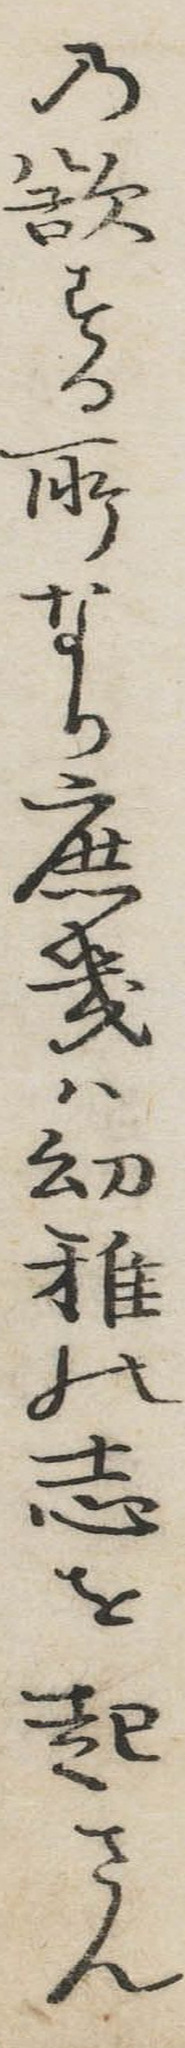の欲する所なり庶幾は幼稚の志を起さん
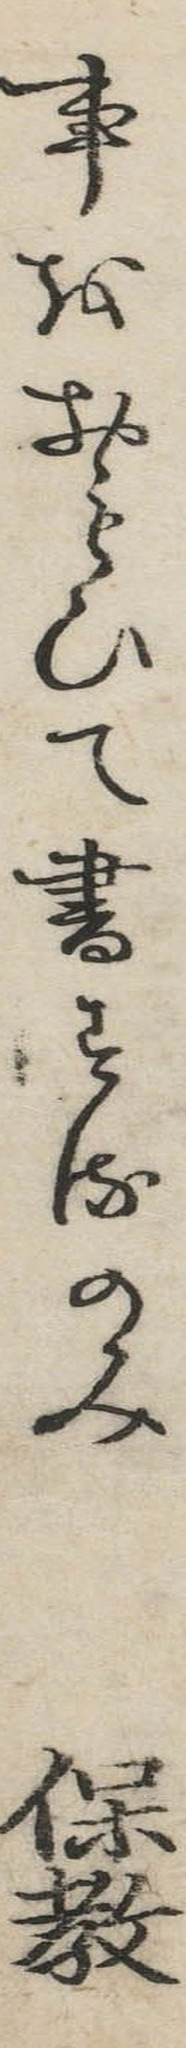事をおもひて書するのみ保教
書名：前訓
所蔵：東京学芸大学附属図書館
